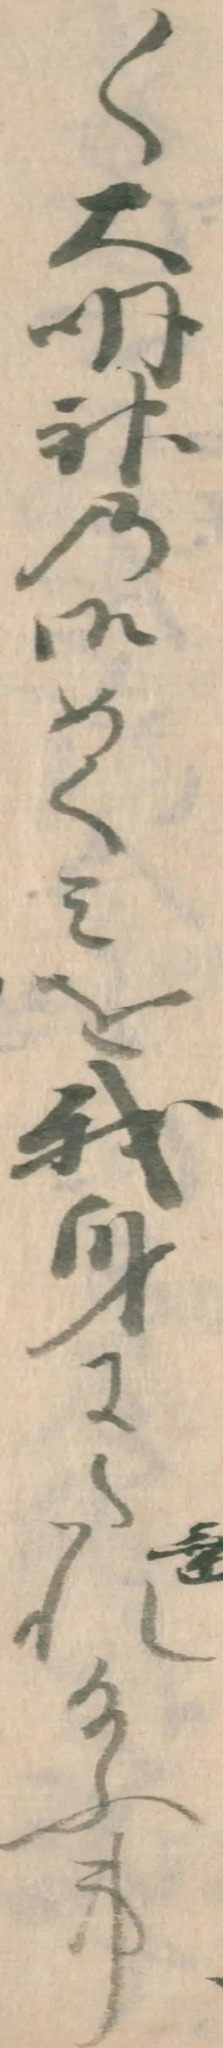〳〵大明神の御めくみを我身にたれ給ふ事
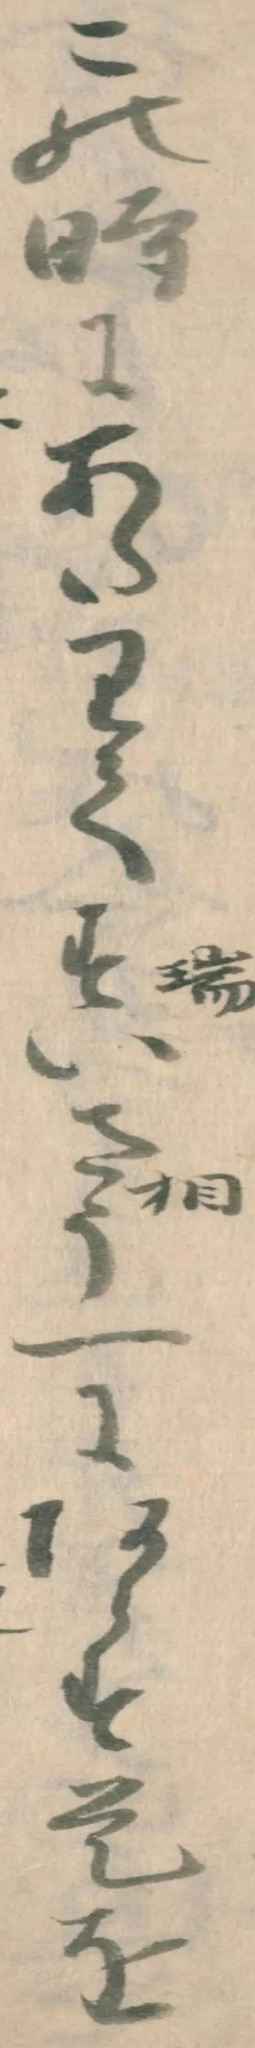この時にあたりてすいさう一にあらす是を
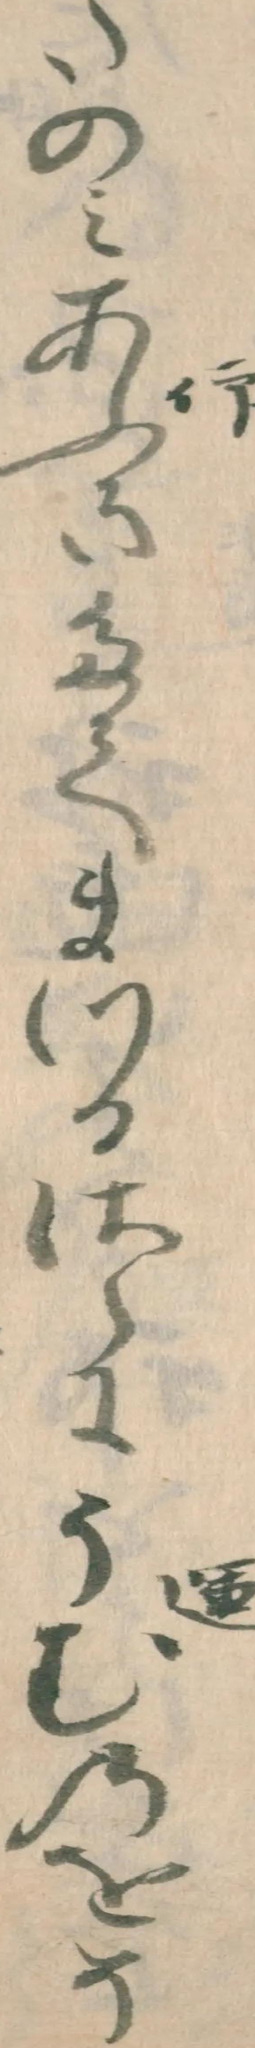たのみあふきたてまつるさらにうむのをそ
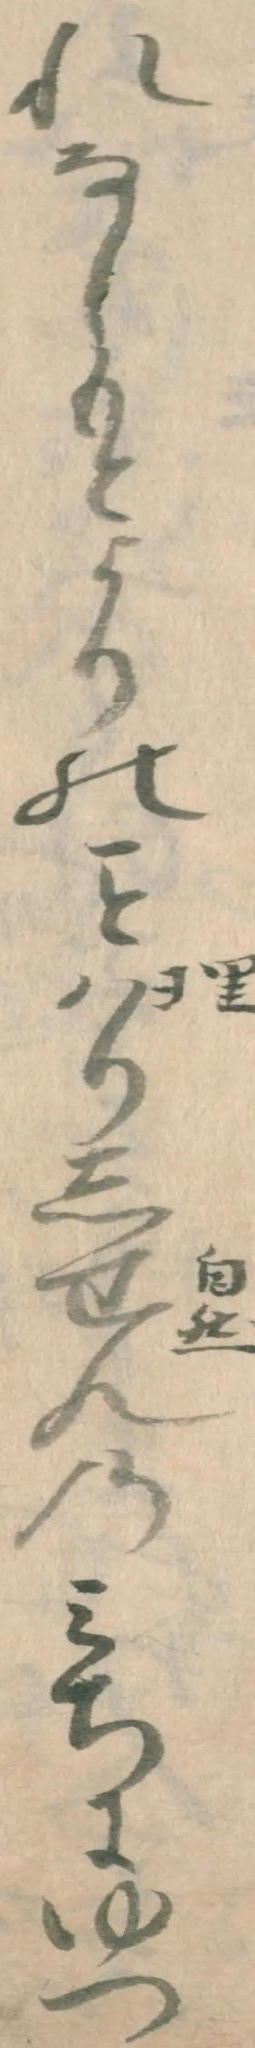れなしもとよりのことはりしせんのみちにゆつ
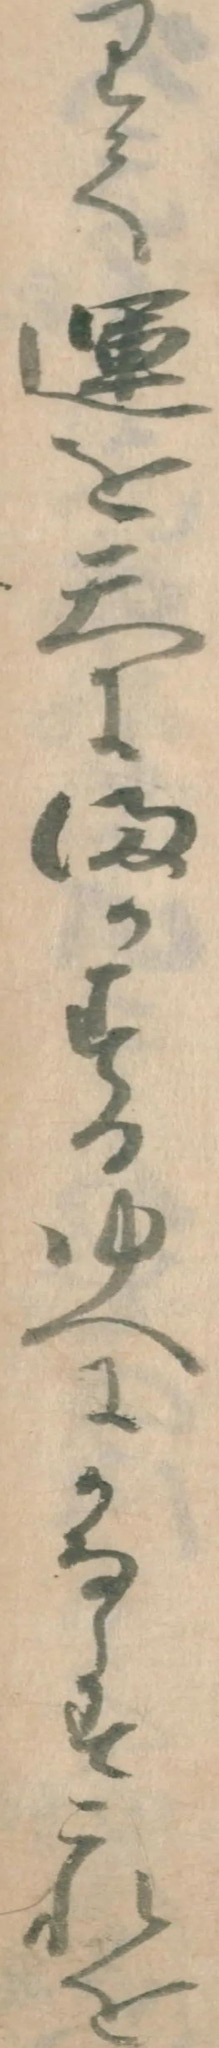りて運を天にまかするゆへにかならすこれを

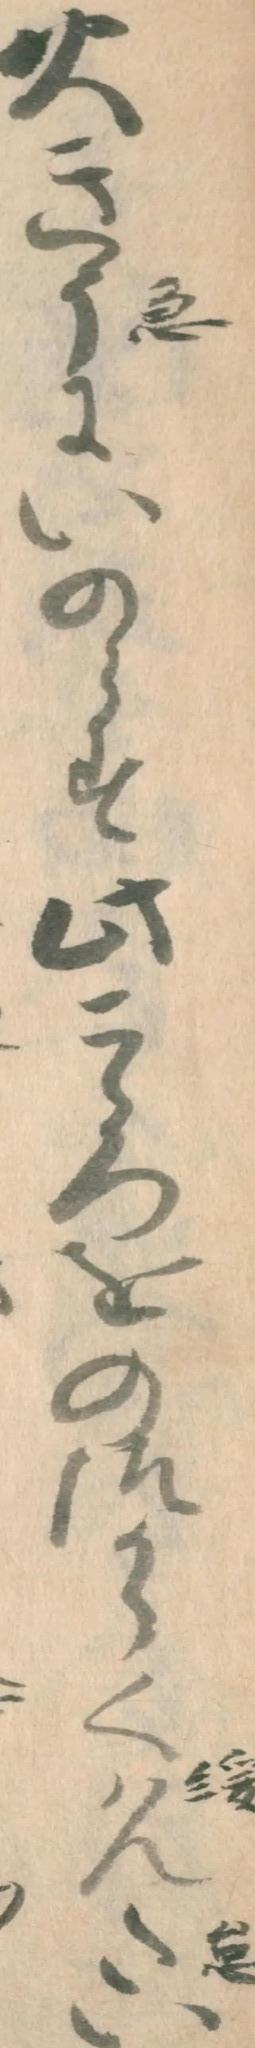火きうにいのらす此こゝろをのつからくはんたい
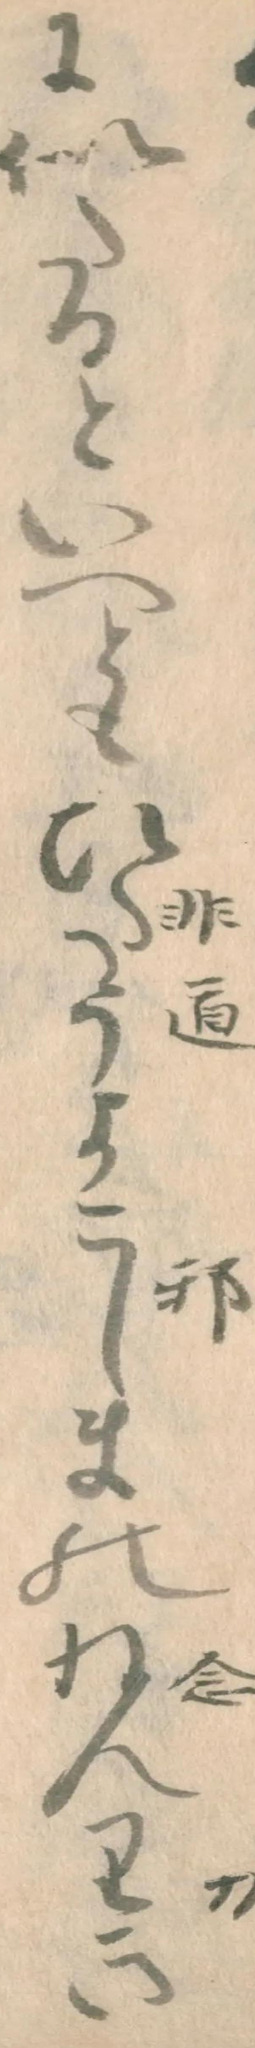に似たるといへともひたうよこしまのねんりき
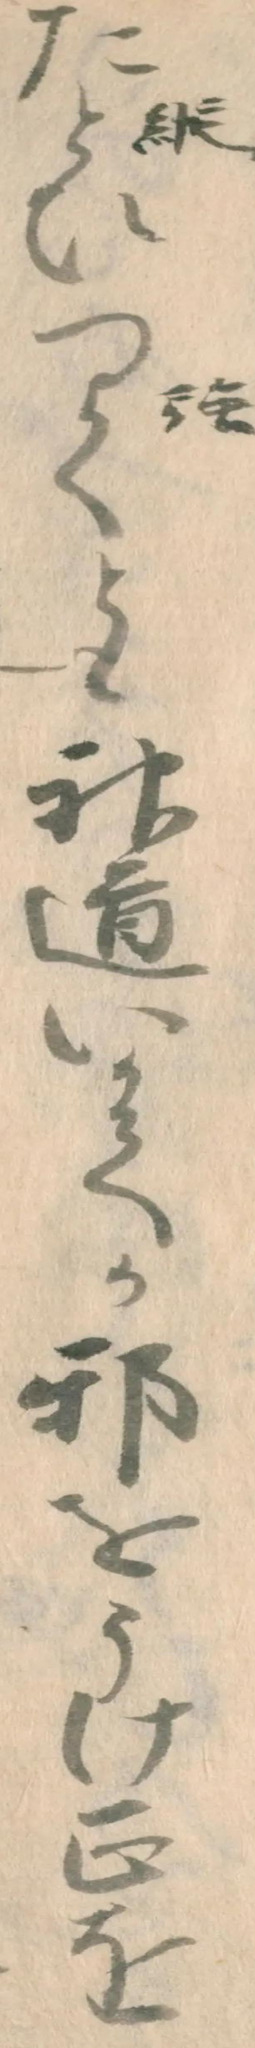たとひつよくとも神道いかてか邪をうけ正を
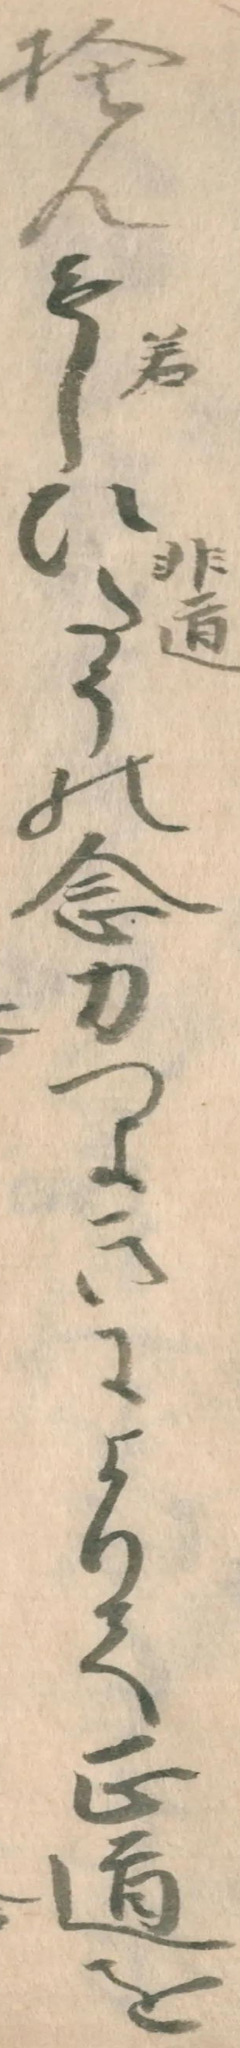捨んもしひたうの念力つよきによりて正道を
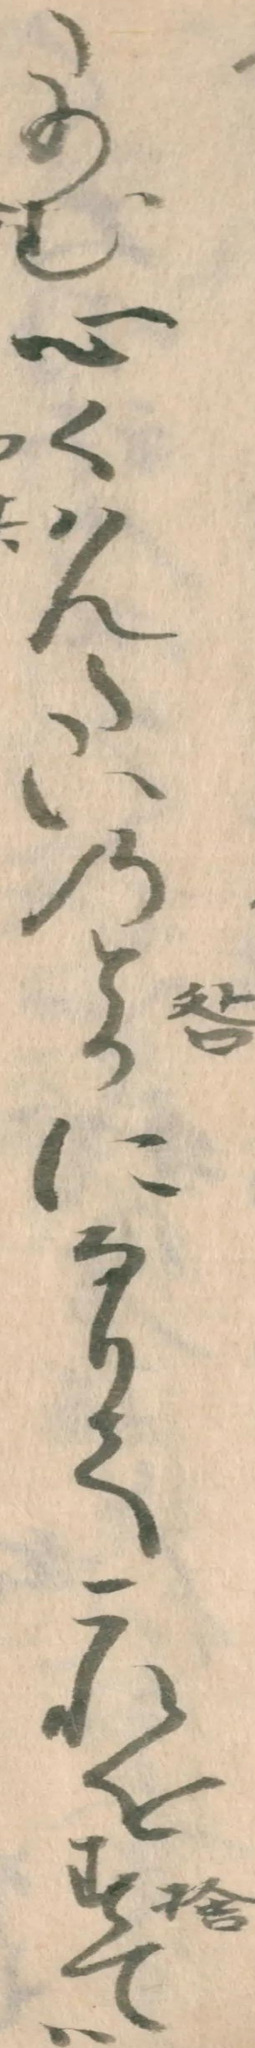たのむ心くはんたいのとかになりてこれをすては
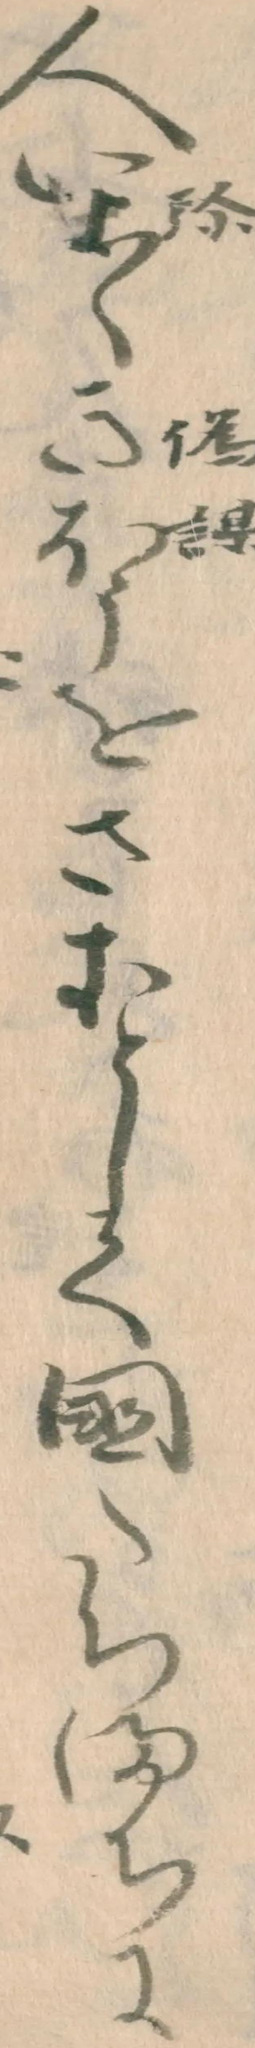人いよ〳〵きほうをさきとして国たちまちに
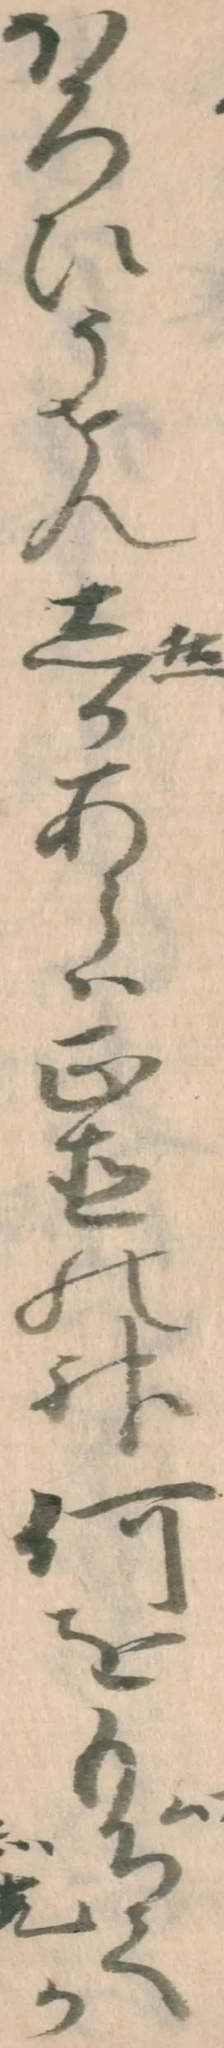ほろひうせんしかあらは正直の神何をもちてか
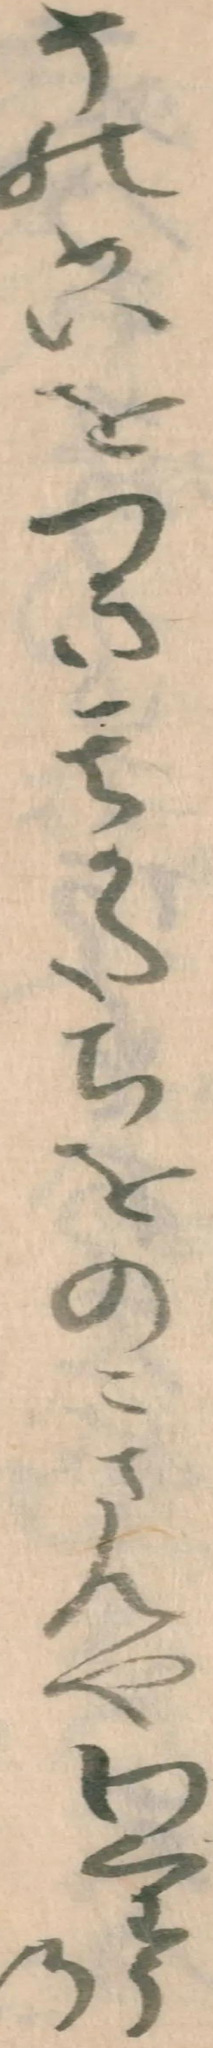そのめいをつき其かたちをのこさんやわくわうの
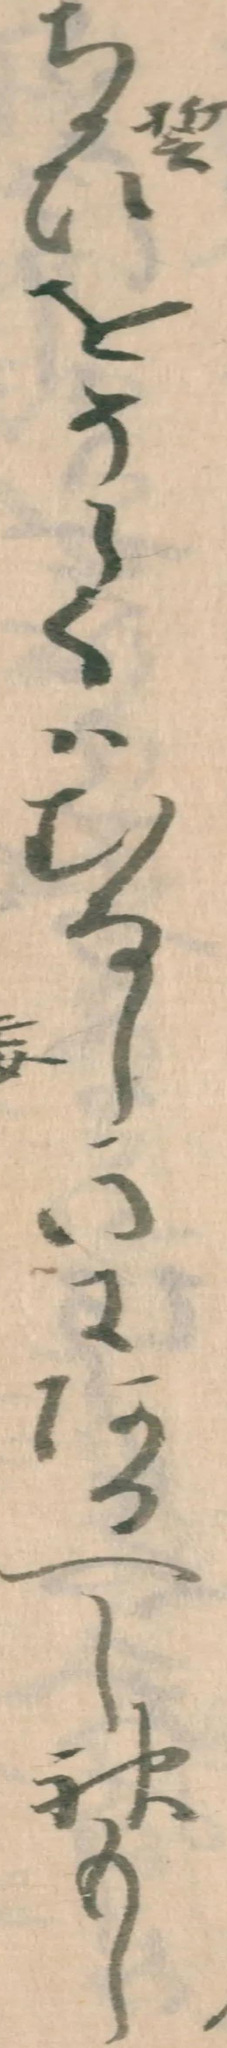ちかひをそらくはむなしきにあるへし神もし
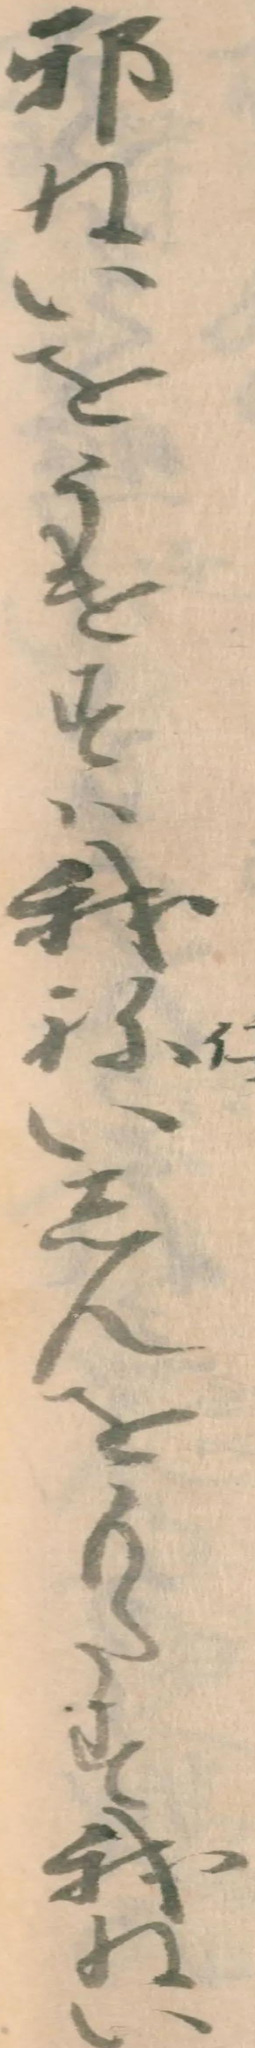邪ねをいをうけすは我ねいしんをもたす我ねい
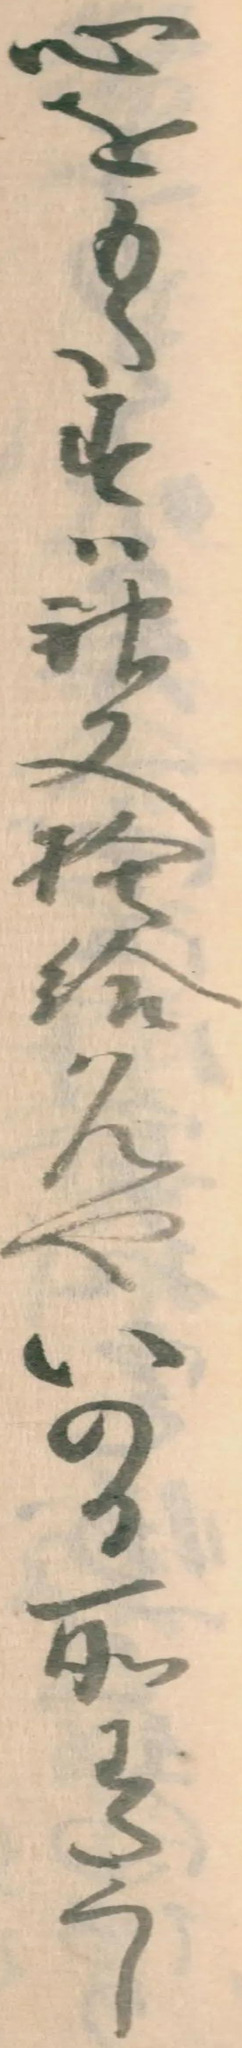心をもたすは神又捨給はんやいのる所わたくし
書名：賀茂社記録. 第1冊
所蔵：国立国会図書館 National Diet Library, JAPAN
